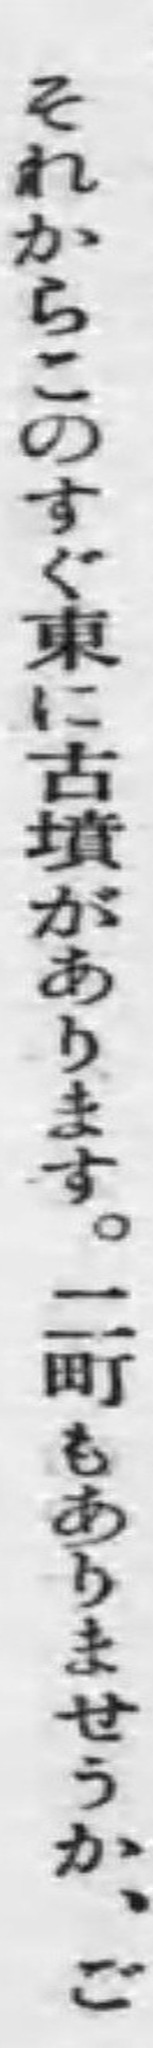それからこのすぐ東に古墳があります。二町もありませうか、ご
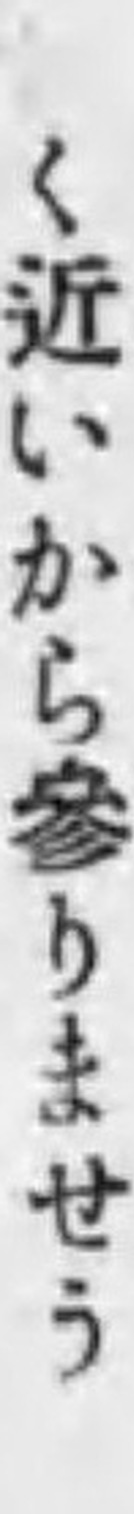く近いから参りませう
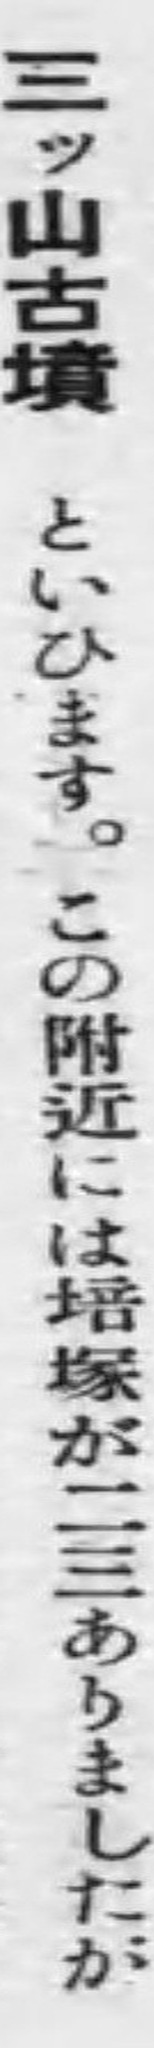三ッ山古墳といひます。この附近には培塚が二三ありましたが
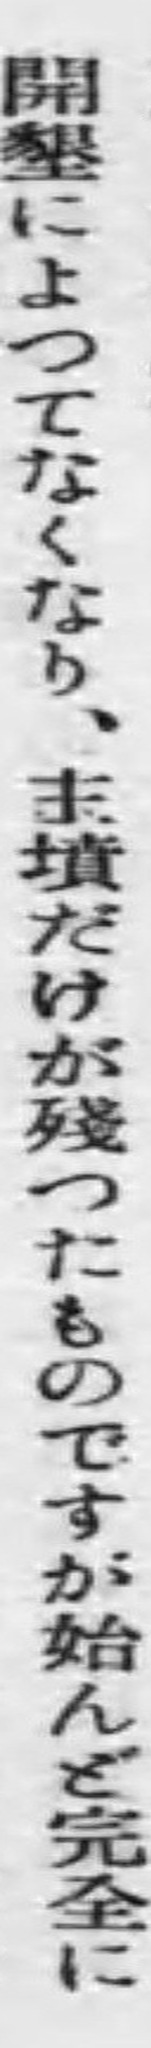開墾によつてなくなり、主墳だけが残つたものですが始んど完全に
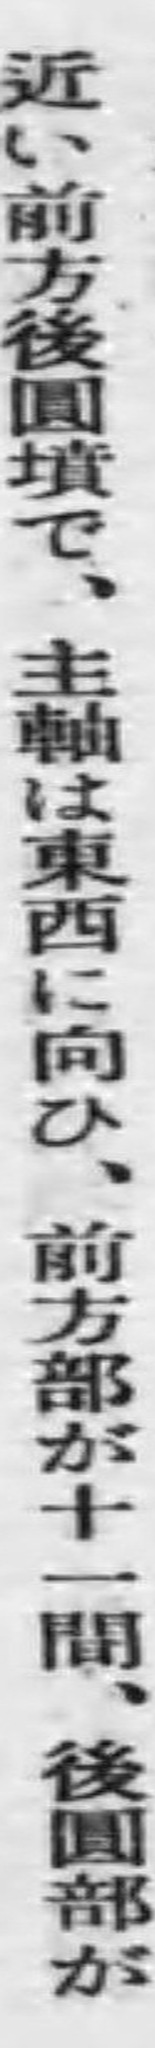近い前方後円墳で、主軸は東西に向ひ、前方部が十一間、後円部が
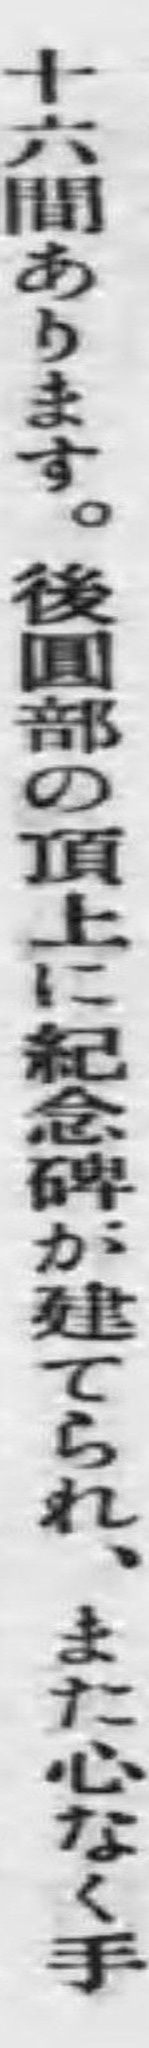十六間あります。後円部の頂上に紀念碑が建てられ、また心なく手
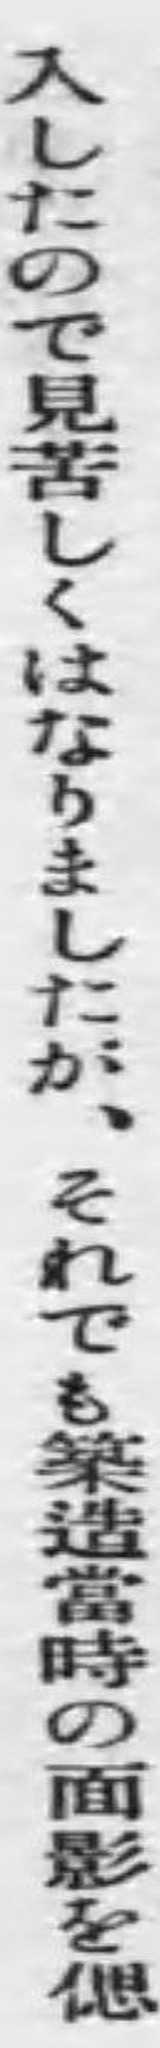入したので見苦しくはなりましたが、それでも築造当時の面影を偲
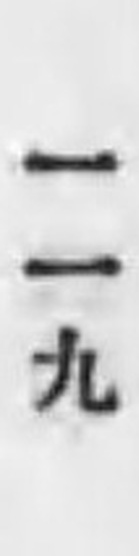一一九

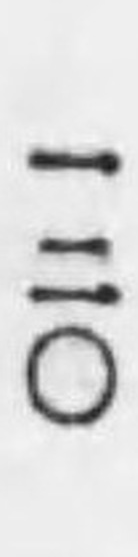一二〇
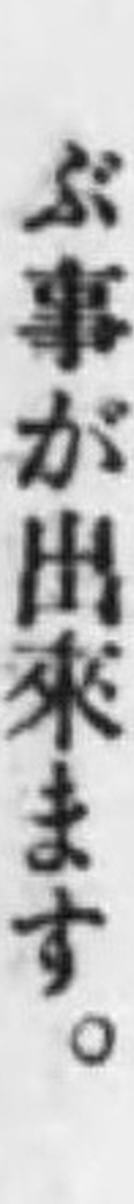ぶ事が出来ます。
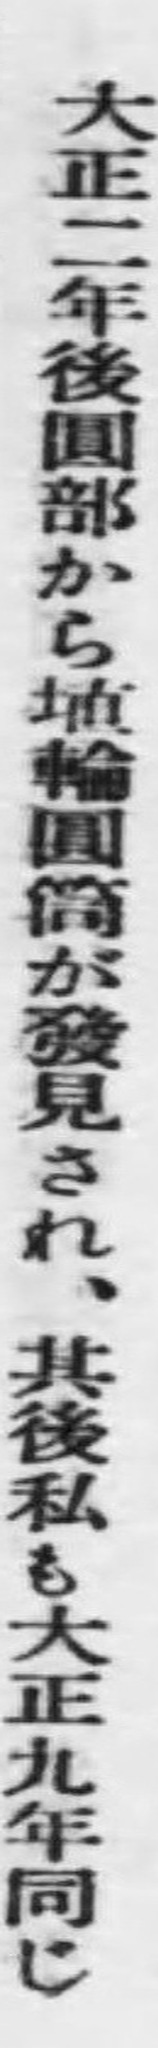大正二年後円部から埴輪円筒が発見され、其後私も大正九年同じ
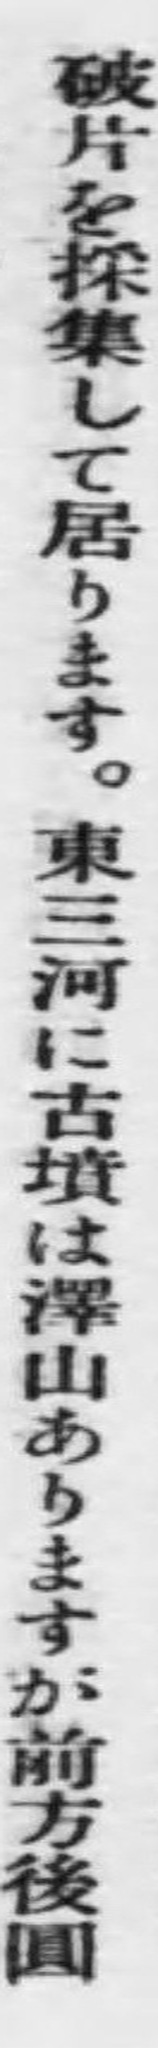破片を採集して居ります。東三河に古墳は沢山ありますが前方後円
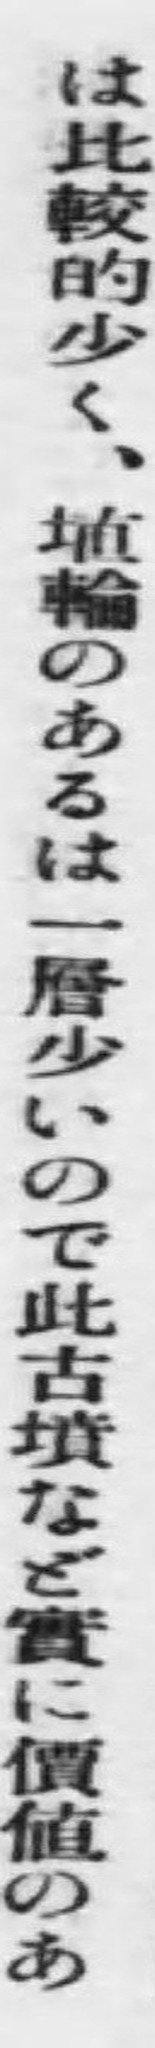は比較的少く、埴輪のあるは一層少いので此古墳など実に価値のあ
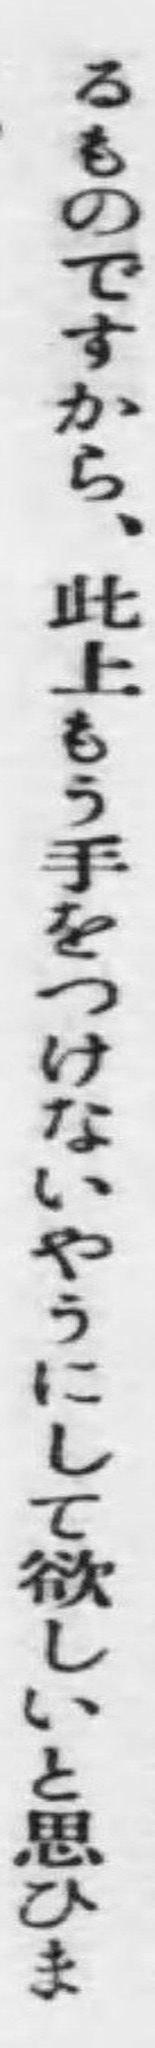るものですから、此上もう手をつけないやうにして欲しいと思ひま
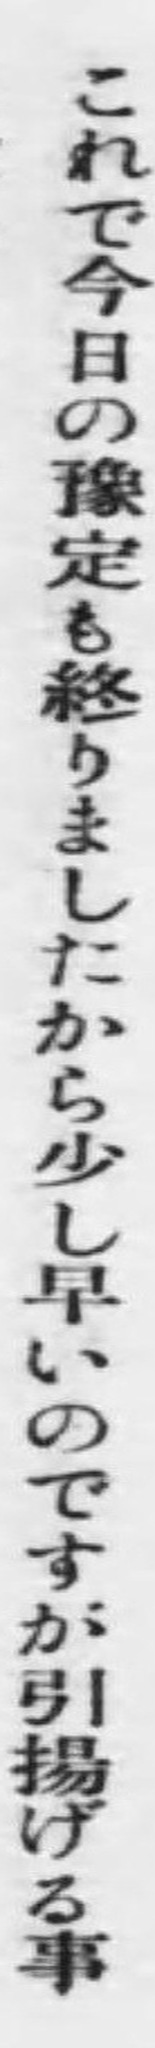これで今日の予定も終りましたから少し早いのですが引揚げる事
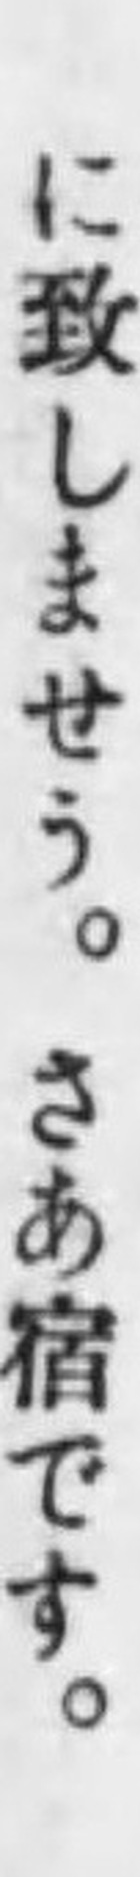に致しませう。さあ宿です。
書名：東三河道中記 : 豊橋市及其附近案内
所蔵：国立国会図書館 National Diet Library, JAPAN
